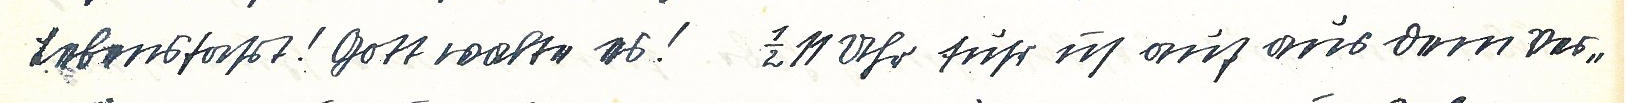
Lebenszeit! Gott walte es! ½ 11 Uhr fuhr ich auf aus dem Ver¬
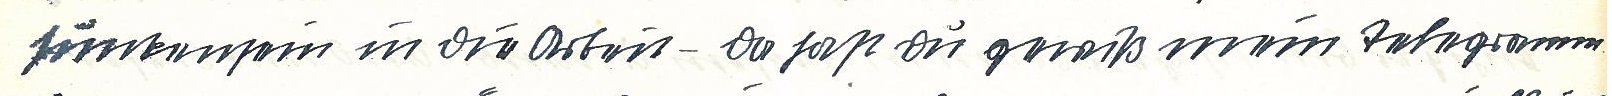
sunkensein in die Arbeit – da hast Du gewiß mein Telegramm
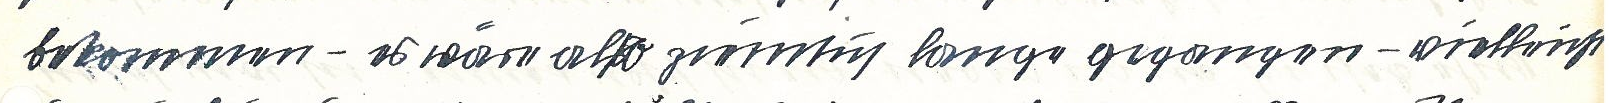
bekommen – es wäre also ziemlich lange gegangen – vielleicht
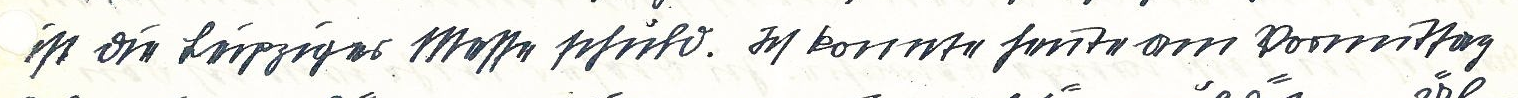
ist die Leipziger Messe schuld. Ich konnte heute am Vormittag
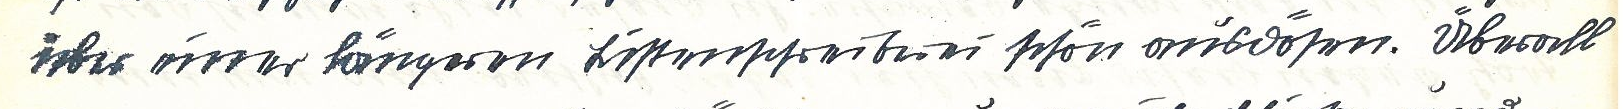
über einer längeren Listenschreiberei schön ausdösen. Überall
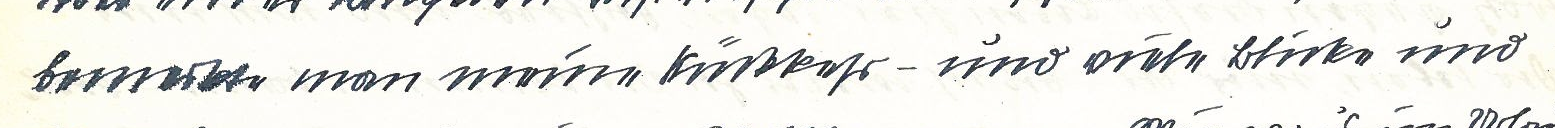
bemerkte man meine Rückkehr – und viele Blicke und
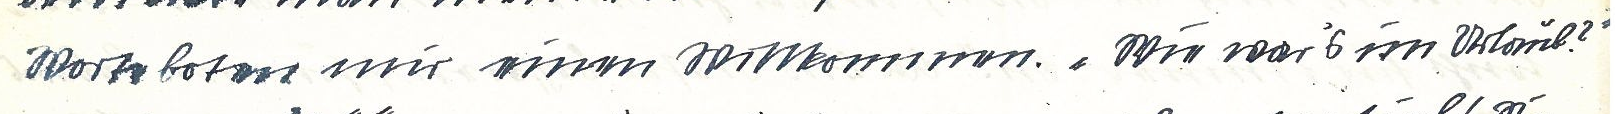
Worte boten mir einen Willkommen. „Wie war´s im Urlaub?”
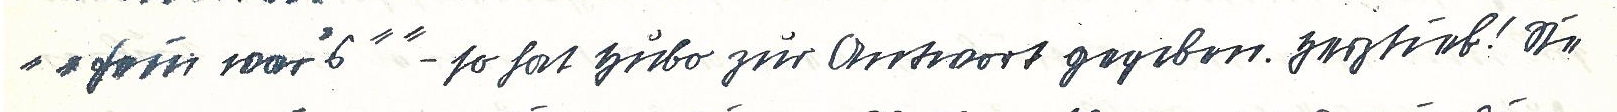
„Fein war´s “” – so hat Hubo zur Antwort gegeben. Herzlieb! sie
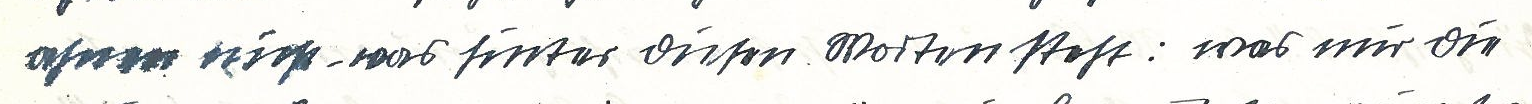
ahnen nicht, was hinter diesen Worten steht: was mir die
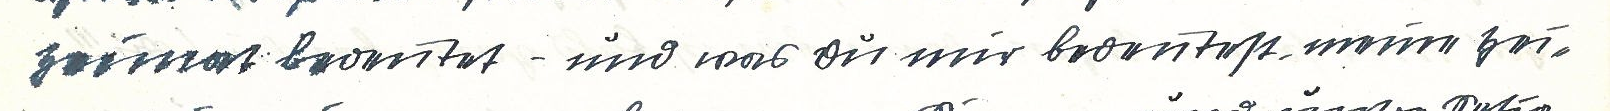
Heimat bedeutet – und was Du mir bedeutest, meine Hei¬
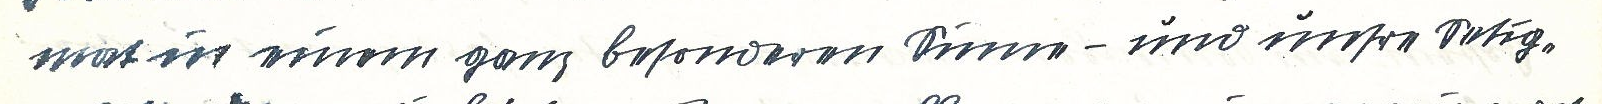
mat in einem ganz besonderen Sinne – und unsere Selig¬
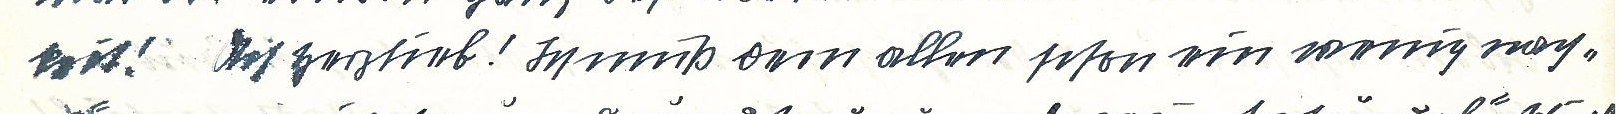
keit! Ach Herzlieb! Ich muß dem allen schon ein wenig nach¬
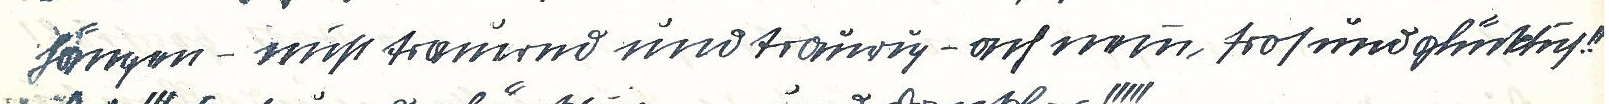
hängen – nicht trauernd und traurig – ach nein, froh und glücklich!!
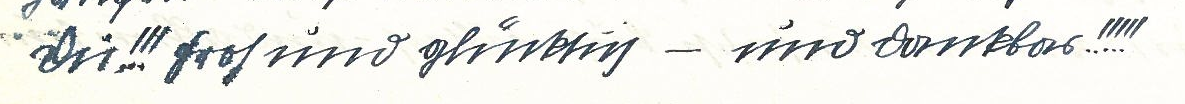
Du!!! Froh und glücklich – und dankbar!!!!!
